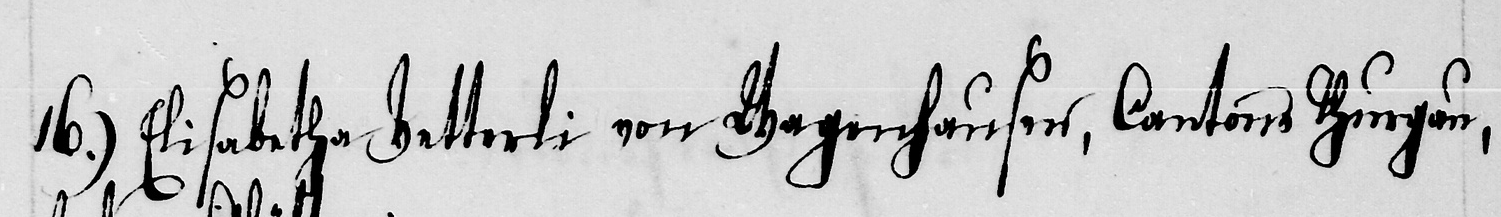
16.) Elisabetha Vetterli von Wagenhausen, Cantons Thurgau,
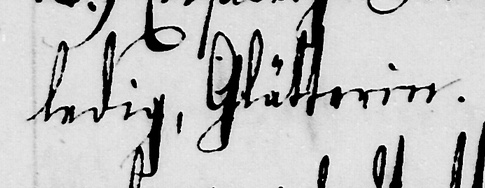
ledig, Glätte¬
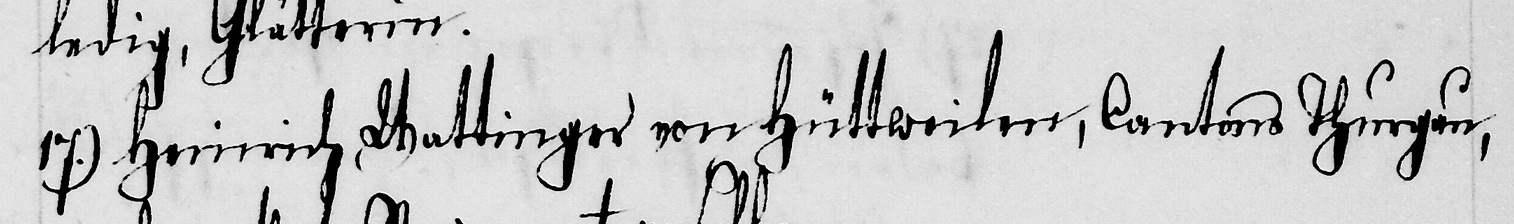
17.) Heinrich Wattinger von Hüttweilen, Cantons Thurgau,
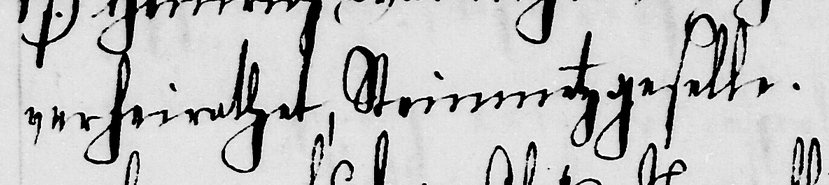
verheirathet, Steinmetzgeselle.
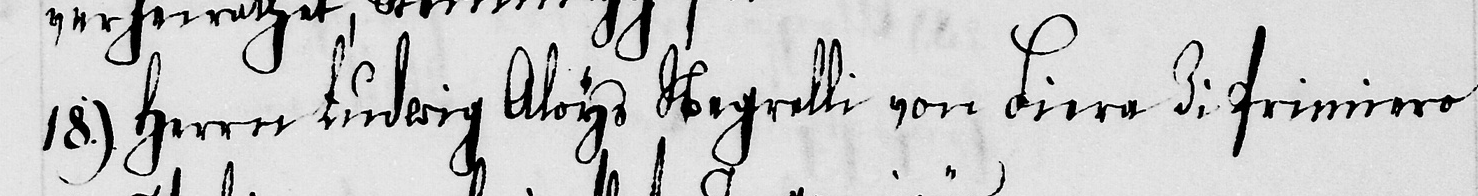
18.) Herrn Ludwig Aloys Negrelli von Fiera di Primiero
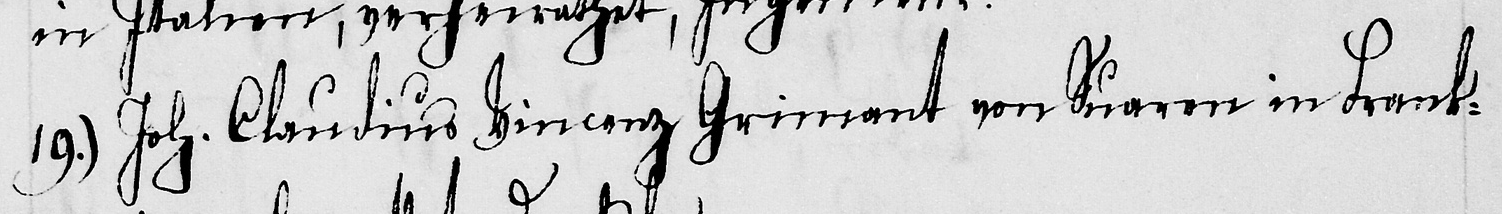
19.) Joh. Claudius Vincenz Grimant von Suaren in Frank¬
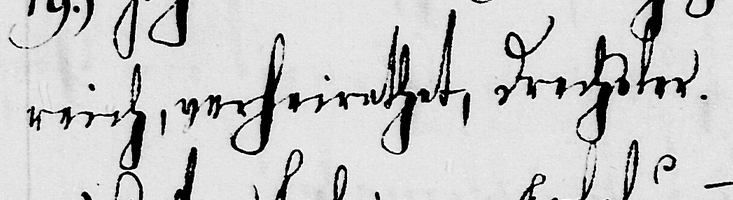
reich, verheirathet, Drechsler.
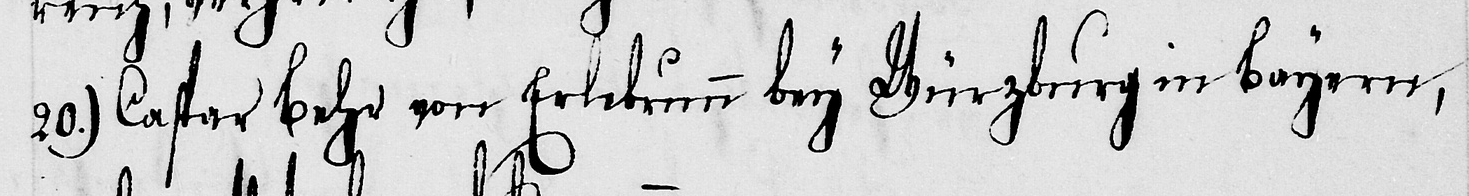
20.) Caspar Behr von Erlebrunn bey Würzburg in Bayern,
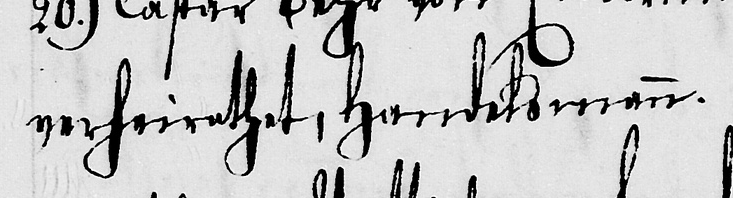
verheirathet, Handelsmann.
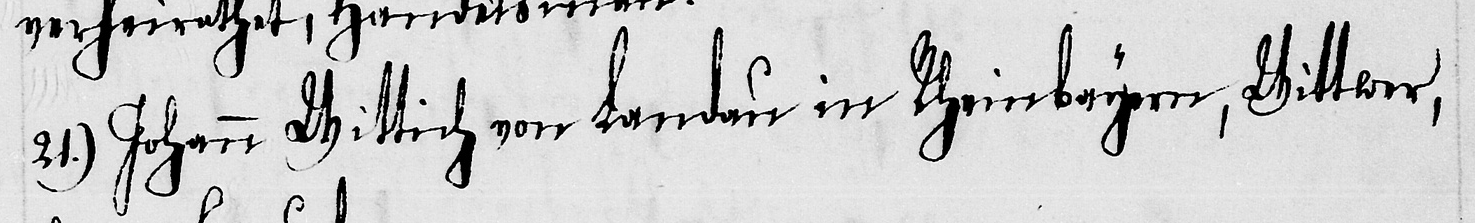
21.) Johann Wittich von Landau in Rheinbayern, Wittwer,
